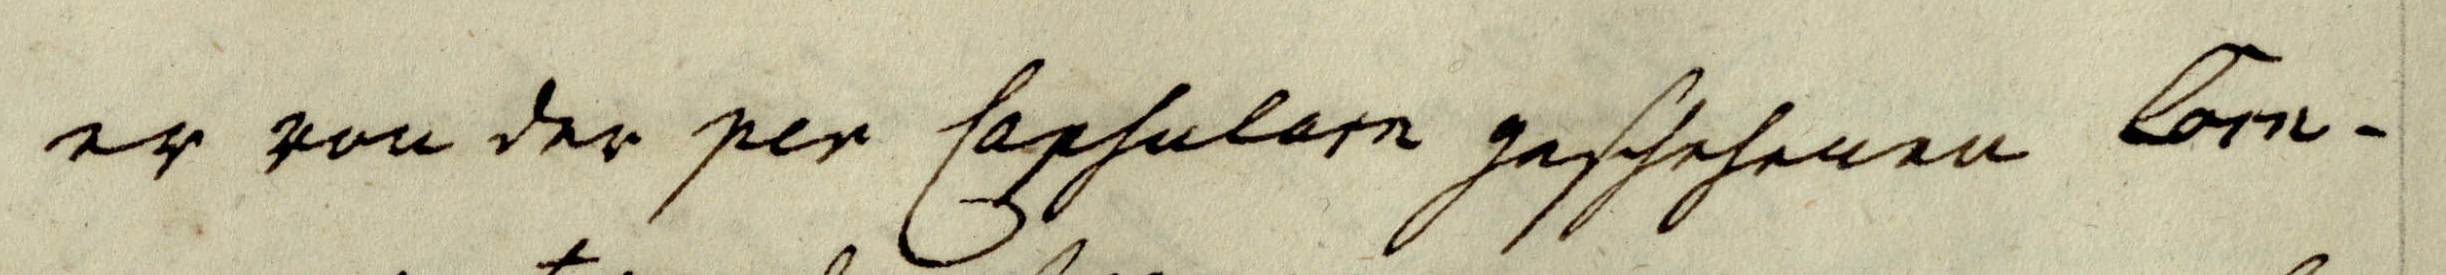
er von der per Capsulam geschehenen Com¬
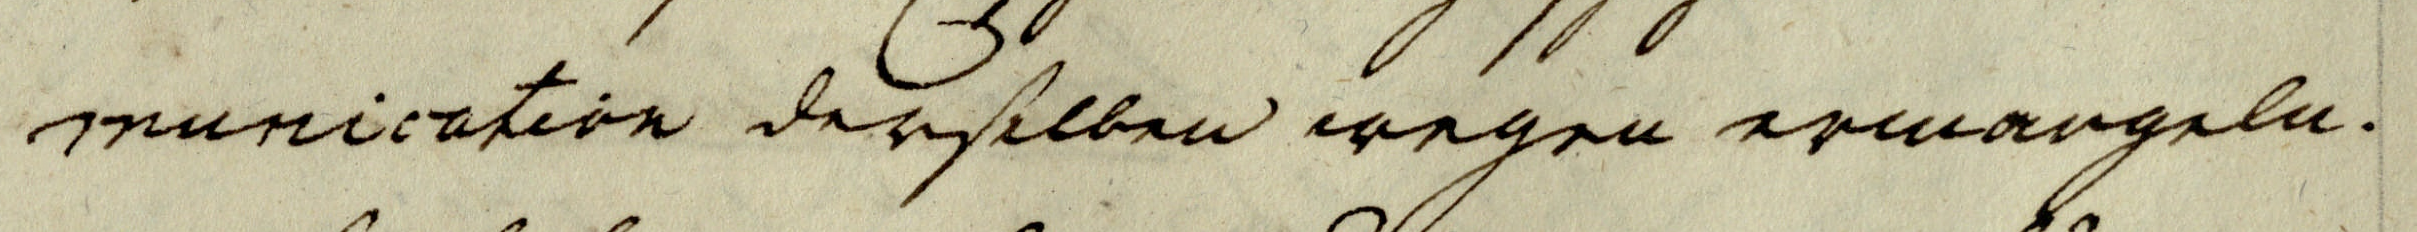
munication derselben wegen ermangeln¬
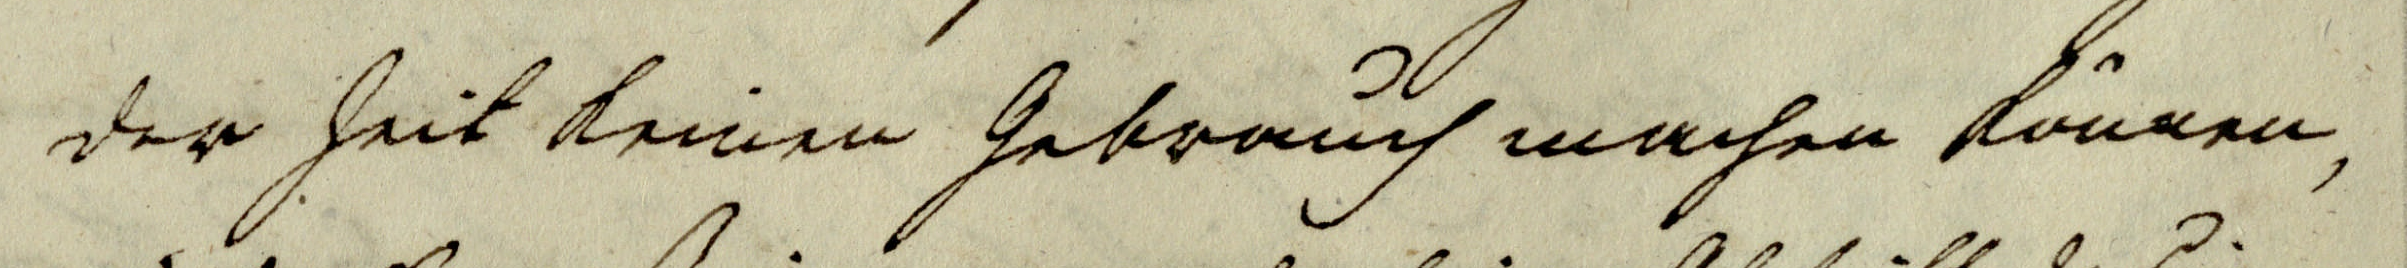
der Zeit keinen Gebrauch machen können,
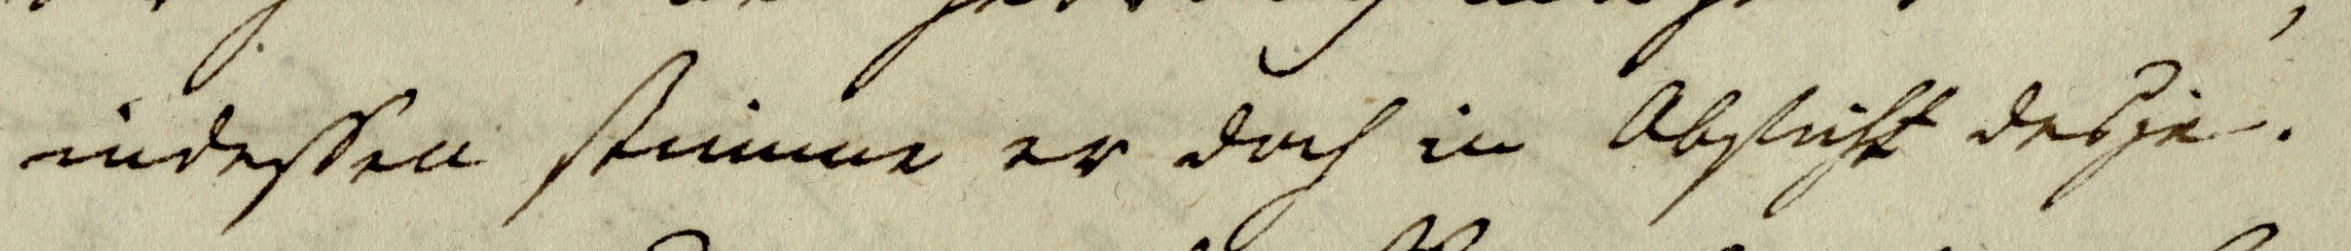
indessen stimme er doch in Absicht desje¬
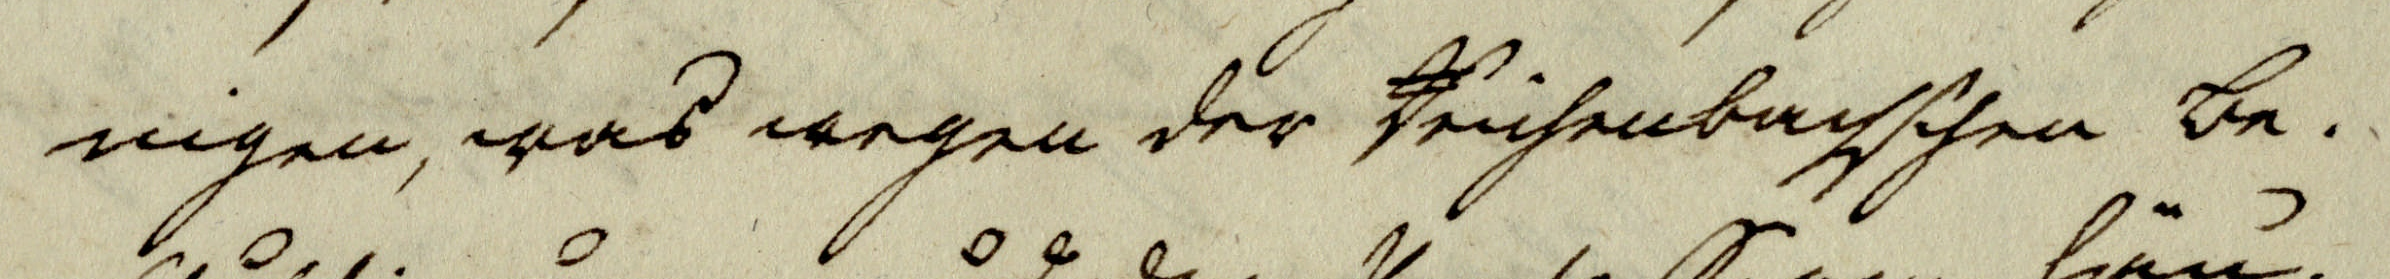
nigen, was wegen der Reichenbachschen Be¬
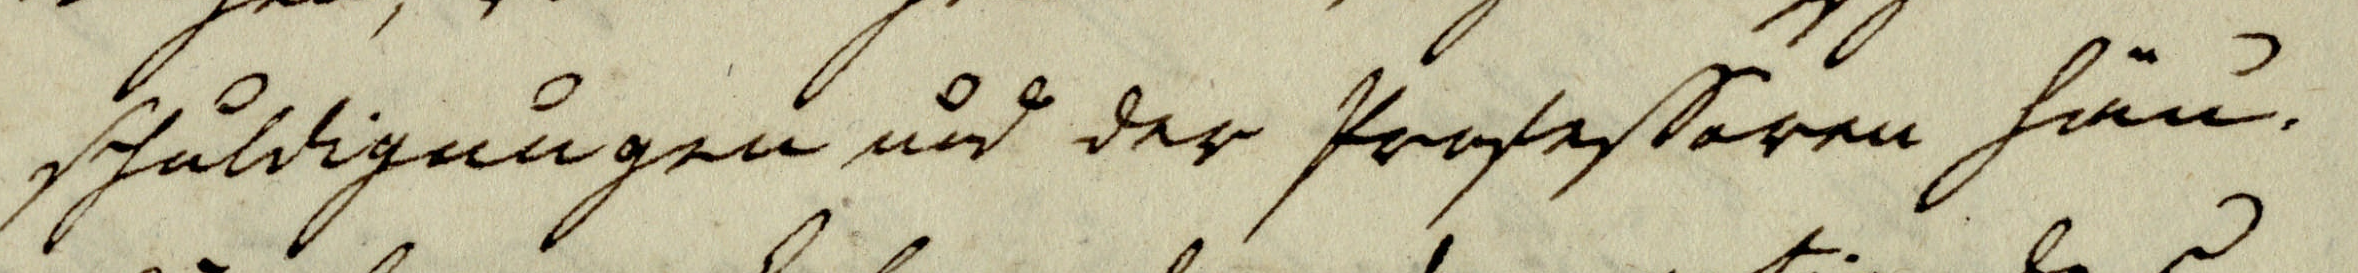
schuldigungen und der Professoren Häu¬
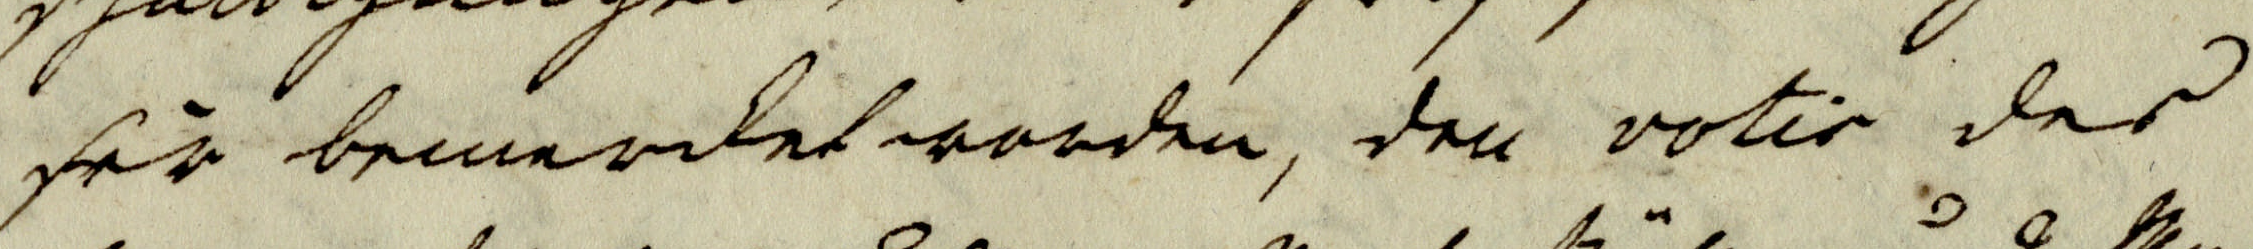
ser bemercket worden, den votis des
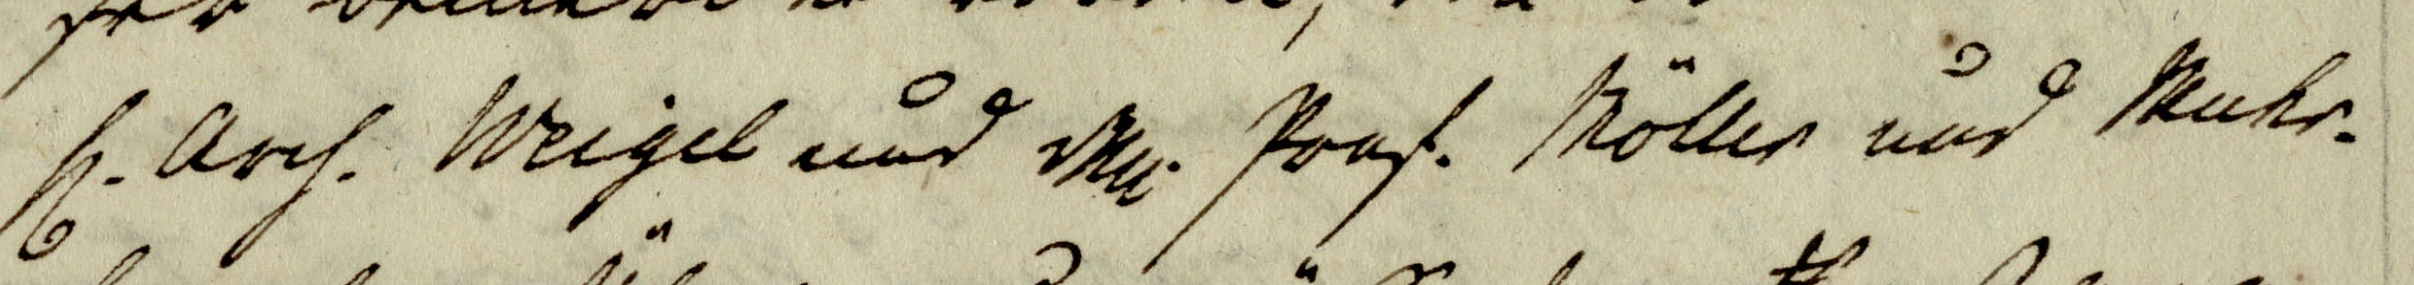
dh. Arch. Weigel und dh. Prof. Möller und Muhr¬
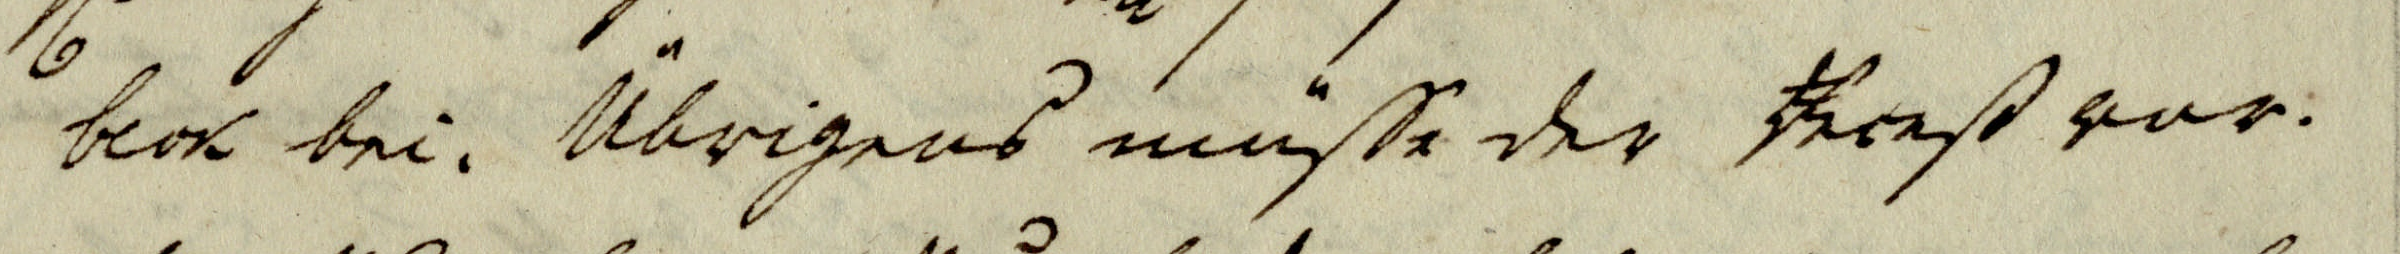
beck bei. Übrigens müsse der Receß vor¬
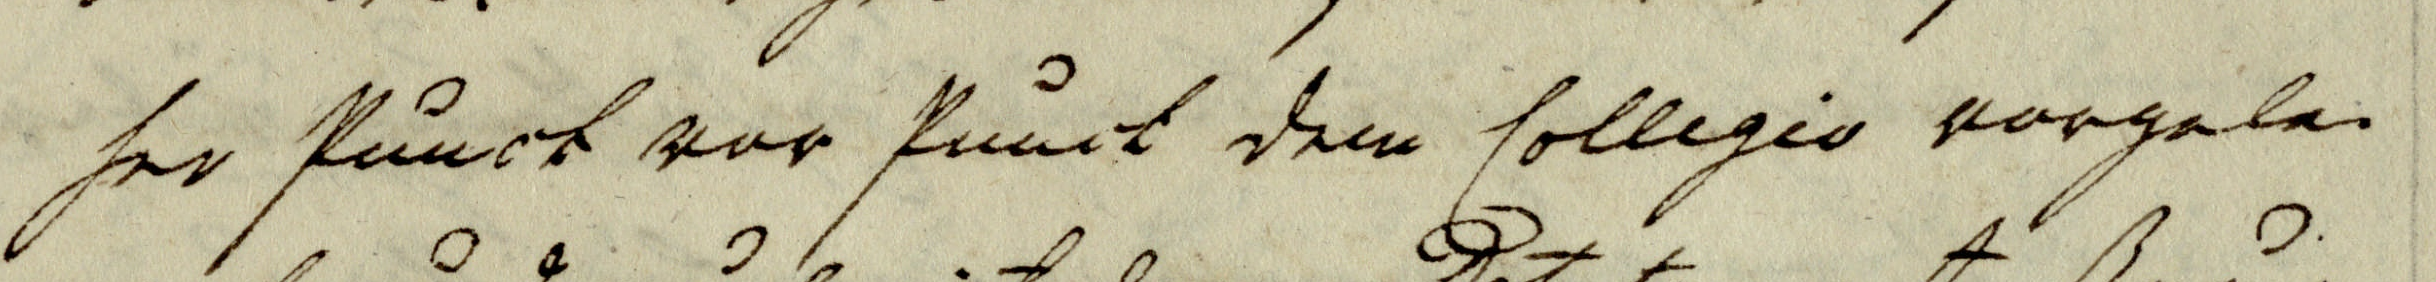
her Punct vor Punct dem Collegio vorgele¬
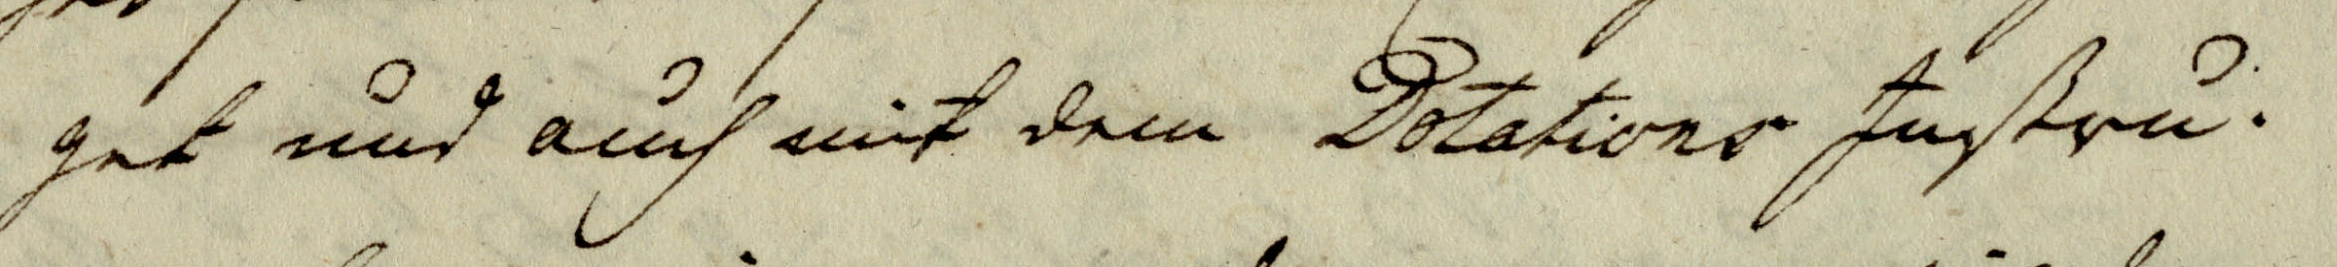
gut und auch mit dem Dotations Instru¬
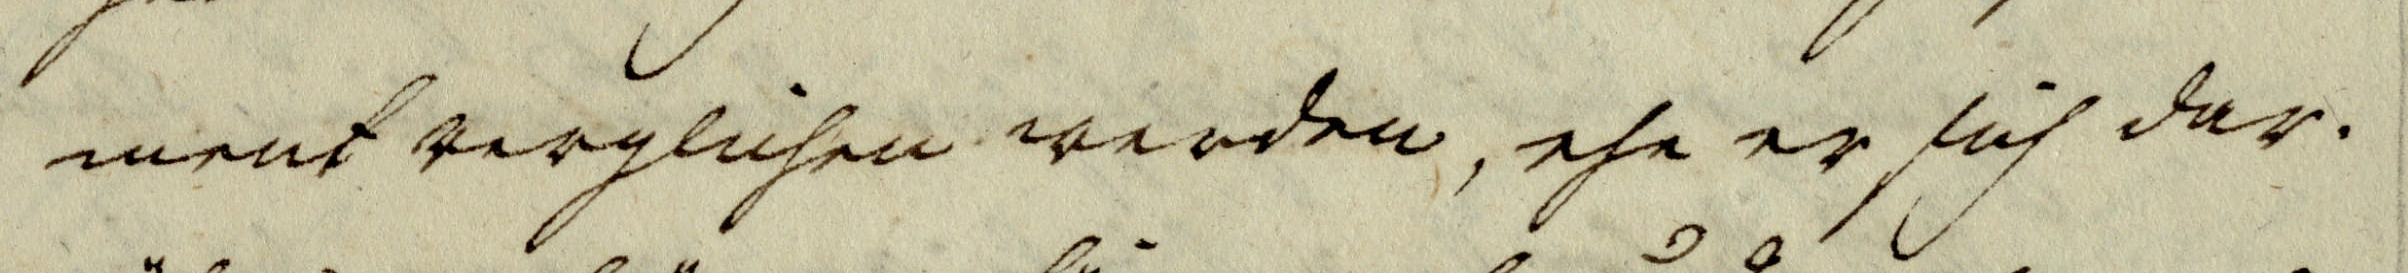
ment verglichen werden, ehe er sich dar¬
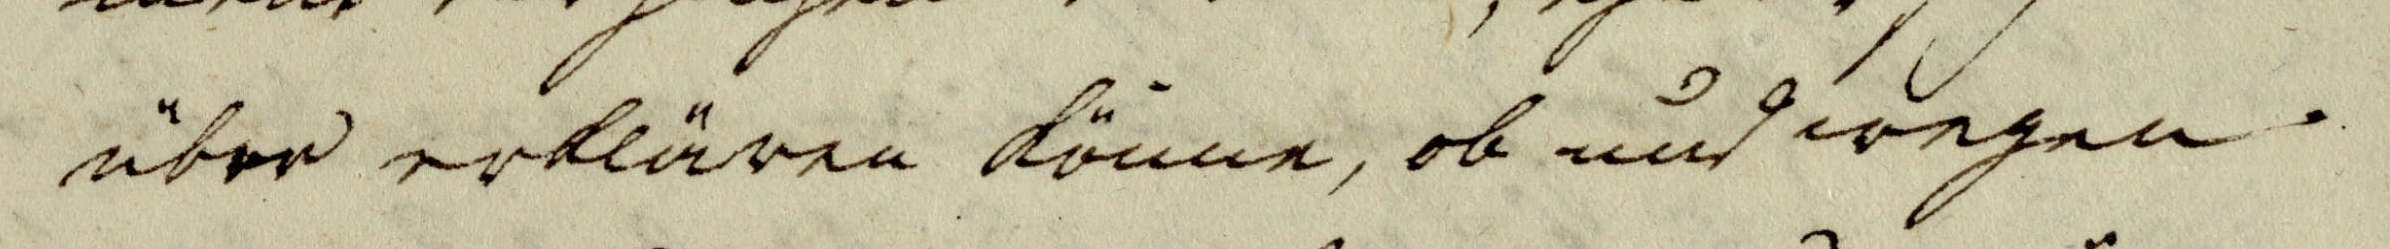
über erklären könne, ob und wegen
